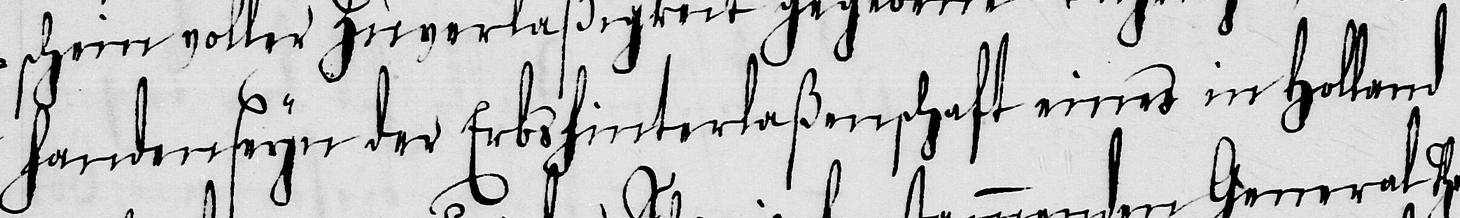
handenseyn der Erbshinterlaßenschaft eines in Holland
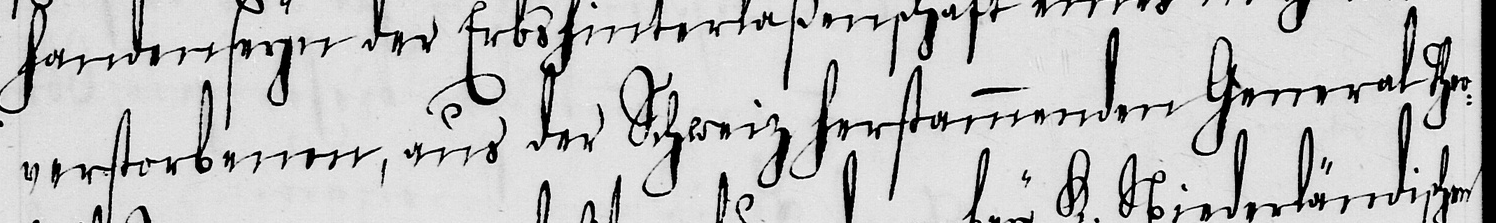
verstorbenen, aus der Schweiz herstammenden General The¬
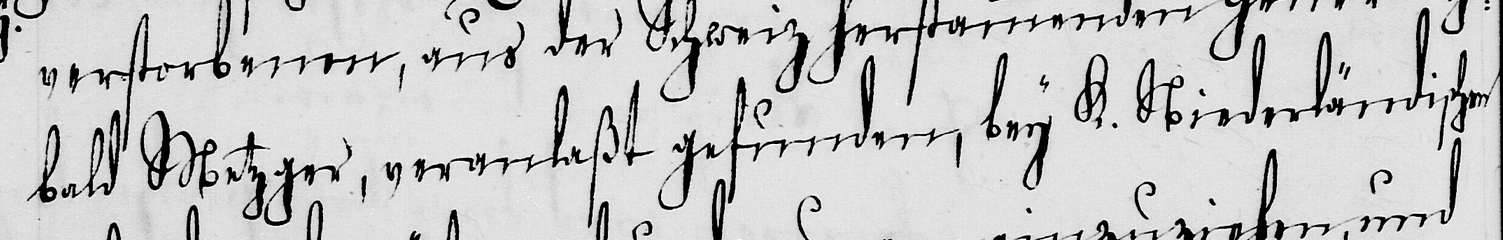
obald Metzger, veranlaßt gefunden, bey K. Niederländisc¬
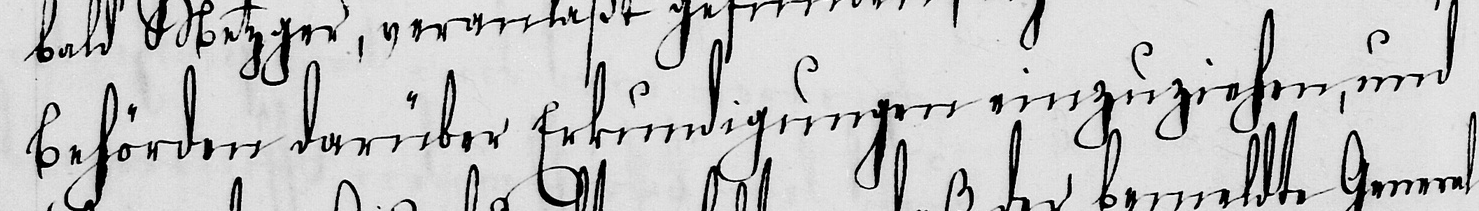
Behörden darüber Erkundigungen einzuziehen, und
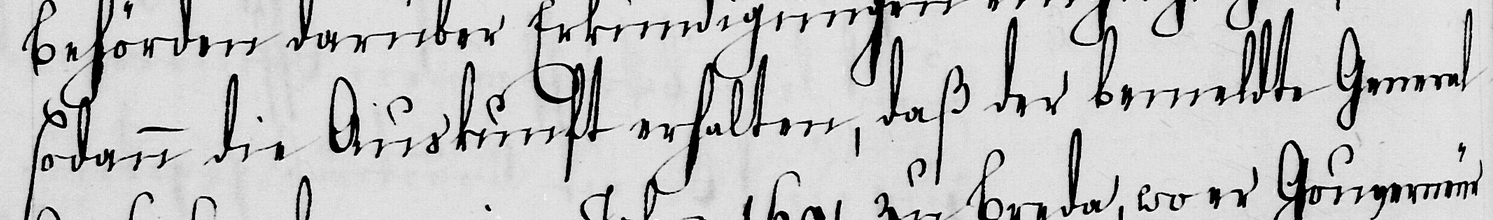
sodann die Auskunft erhalten, daß der bemeldte General
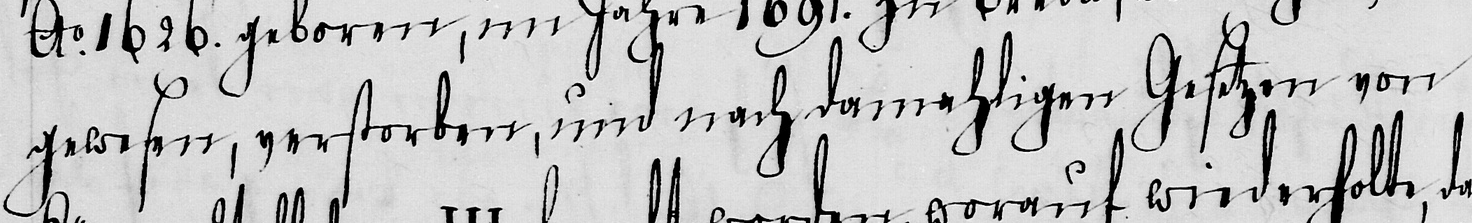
gewesen, verstorben, und nach damahligen Gesetzen von
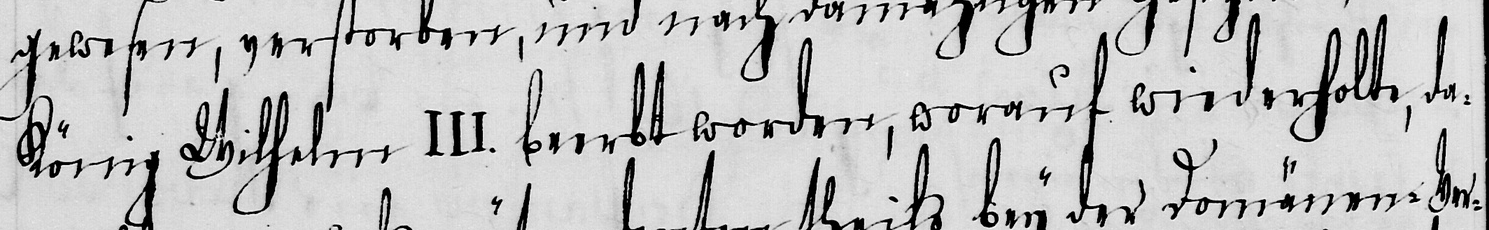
König Wilhelm III. beerbt worden, worauf wiederholte, d¬
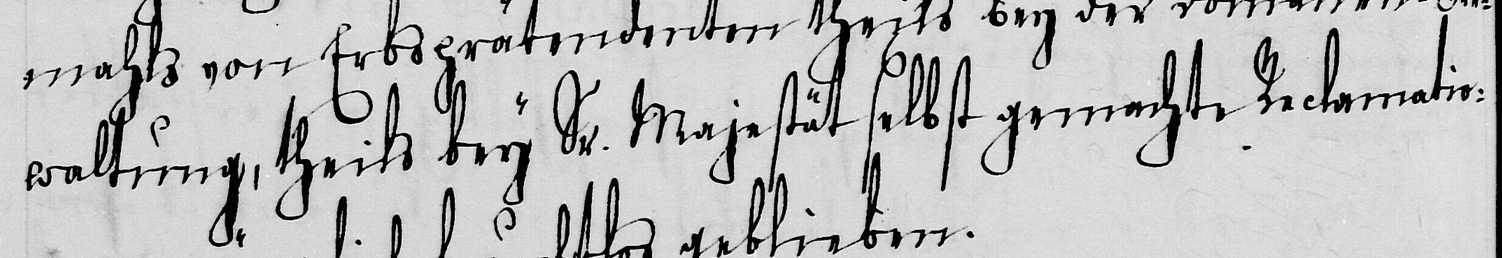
waltung, theils bey Sr. Majestät selbst gemachte Reclamati¬
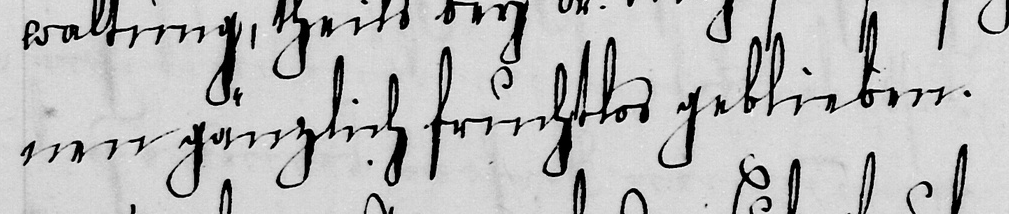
onen gänzlich fruchtlos geblieben.
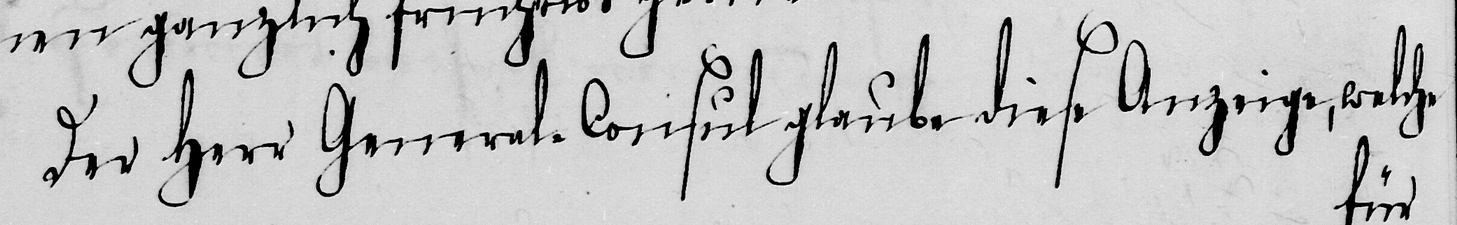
Der Herr General-Consul glaube diese Anzeige, wel¬
